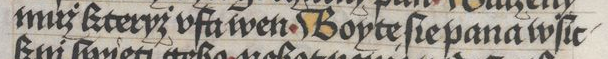muż kteryż vſa wen.Boyte ſie pana wẛic¬
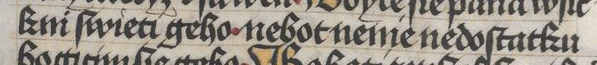kni ſwietí geho.nebot neníe nedoſtatku
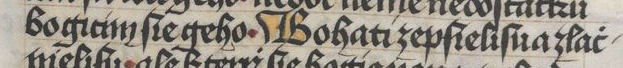bogicím ſie geho.Bohatí zepſieliſu a zlaċ¬
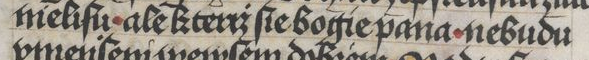nieliſu.ale kteriż ſie bogíe pana.nebudu
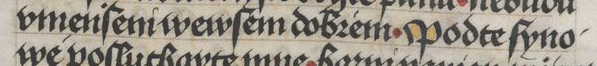vmenẛeni wewſem dobrém.Podte ſyno¬
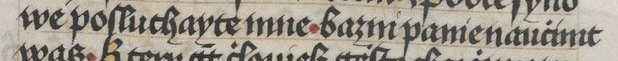wé poſluchayte mne.bazni panie nauċímt
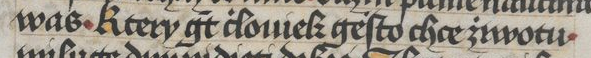was.Ktery ḡt ċlouiek geẛto chce żiwotu.
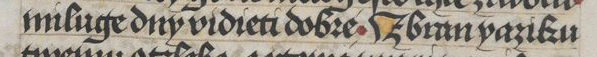miluge dny vidieti dobré.Zbran yaziku
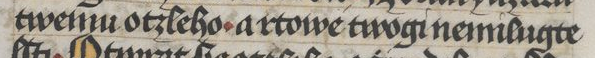twenu otzleho.a rtowé twogi namilugte
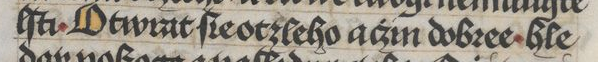lſti.Otwrat ſie otzleho a cżin dobree.hle¬
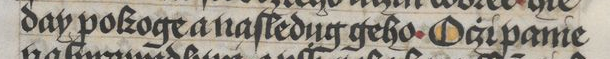day pokoge a naſledug geho.Ocżi panie
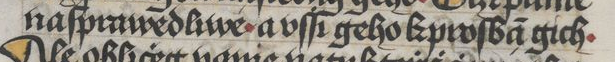naſprawedliwé.a vẛſi geho k proſbā gich.
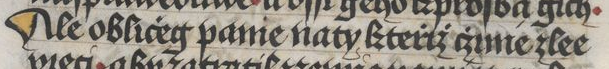Ale obliċeg panie naty kteṙíż cżiníe zlee
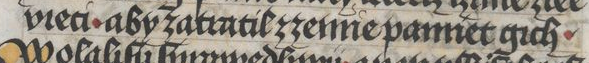vieci.aby zatratil z zemie pamiet gich.
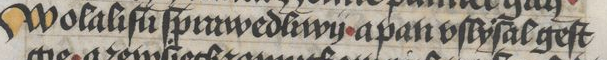Wolaliſu ſprawedliwij.a pan vſlyẛal geſt
